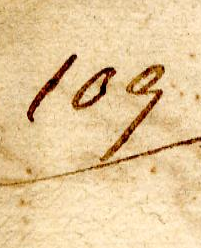109
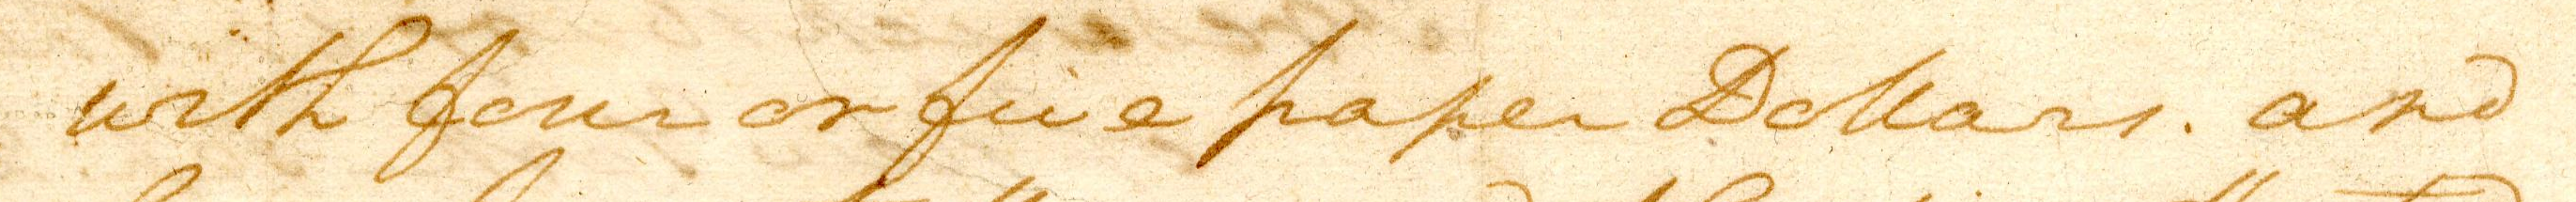with four or five paper Dollars, and
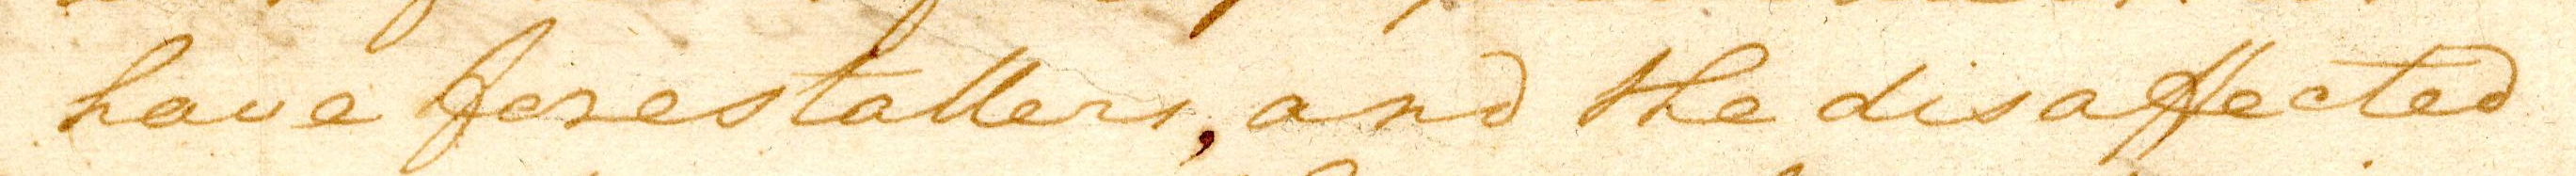have forestallers, and the disaffected
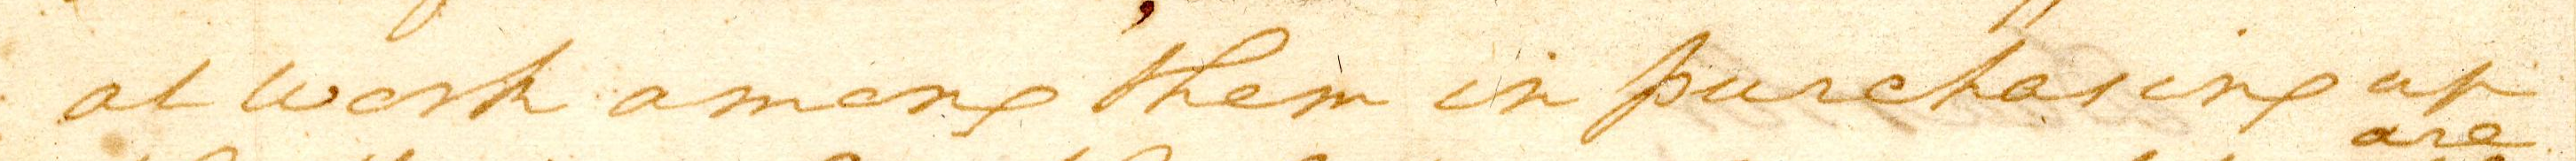at work among them in purchasing up
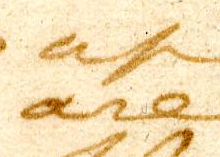are
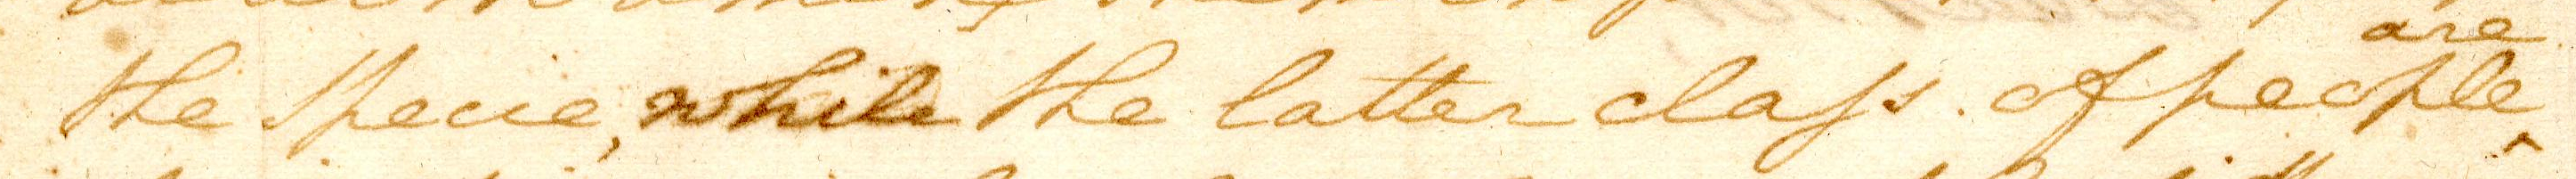the specie, while the latter class of people ^
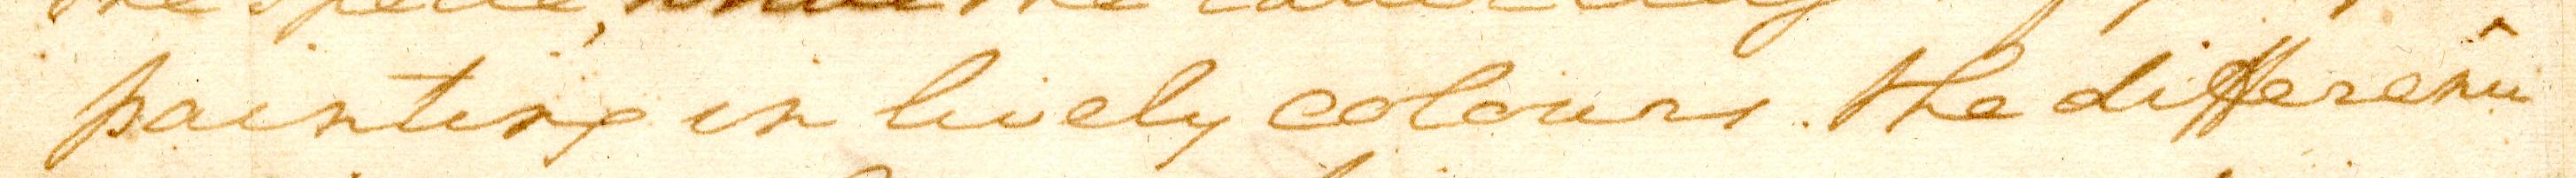painting in lively colours the difference
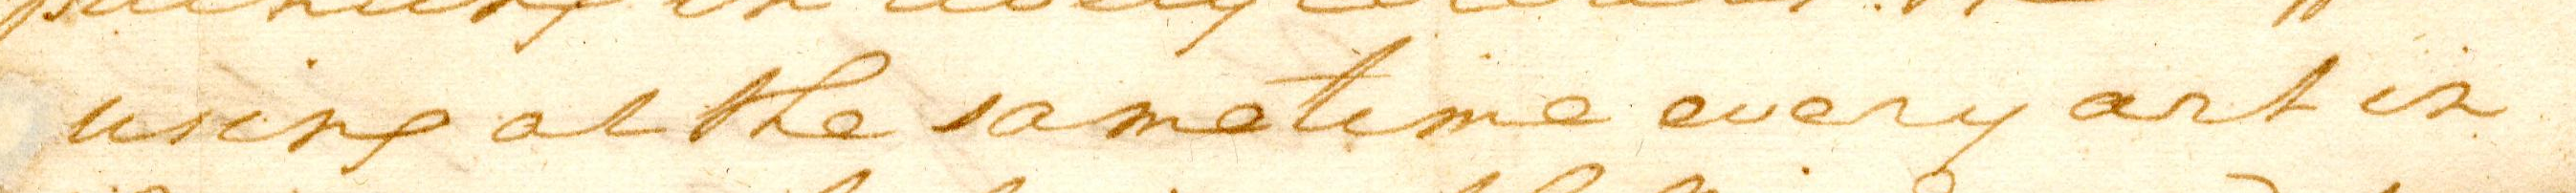using at the same time every art in
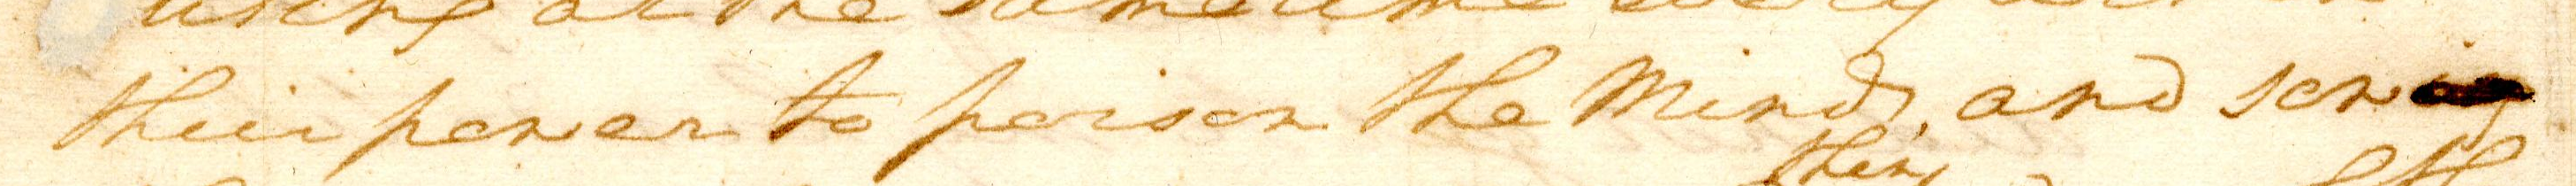their power to poison the Mind, and sew[ing]
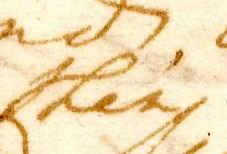their
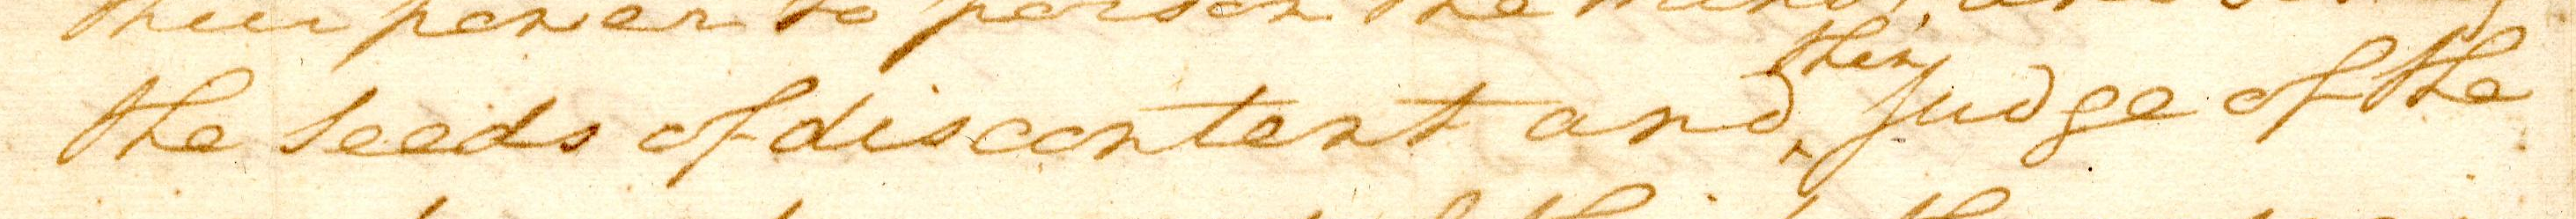the seeds of discontest and ^ judge of the
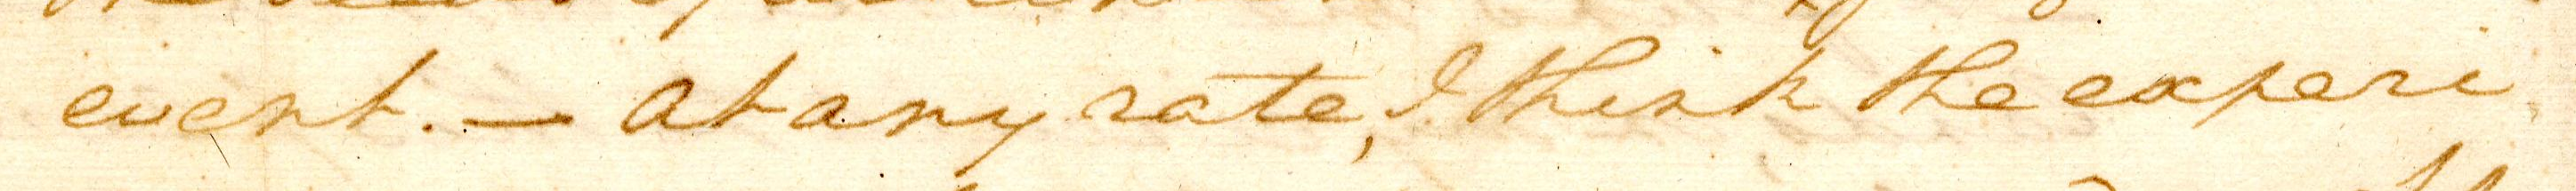event.- at any rate, I think the experi
